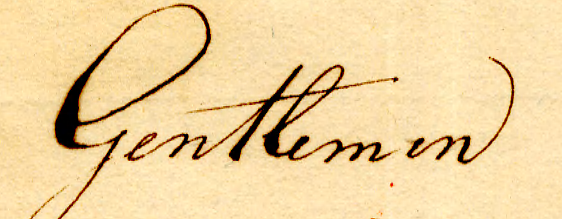Gentlemen
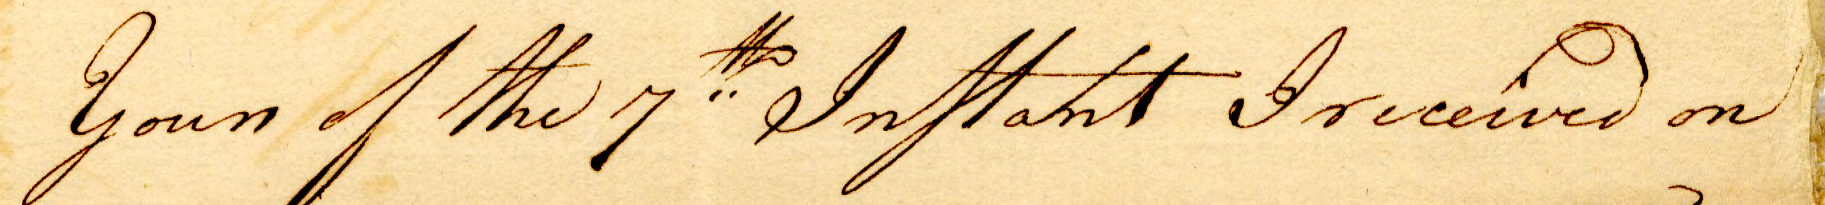Yours of the 7^th Instant I received on
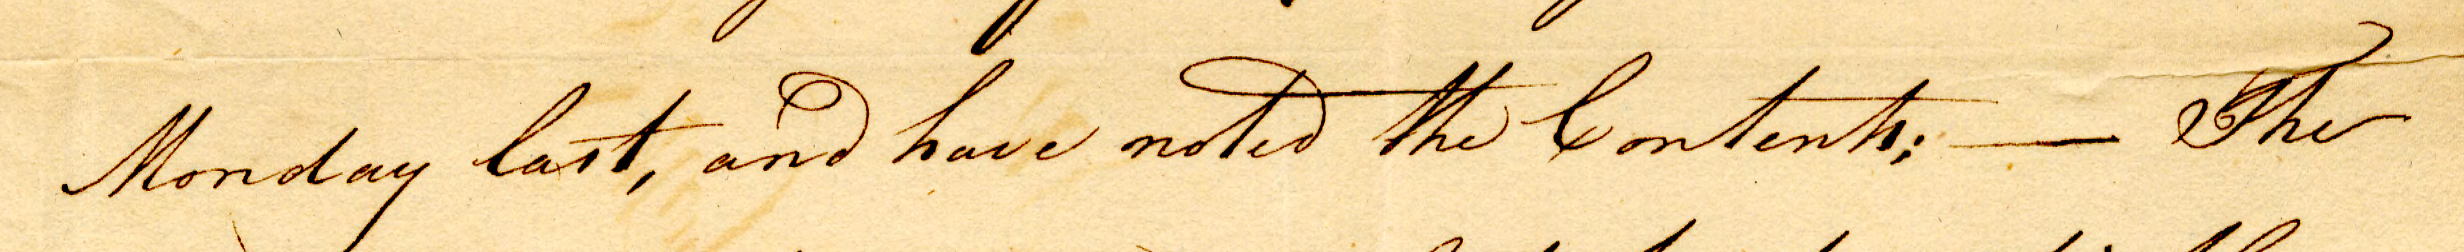Monday last, and have noted the Contents;- The
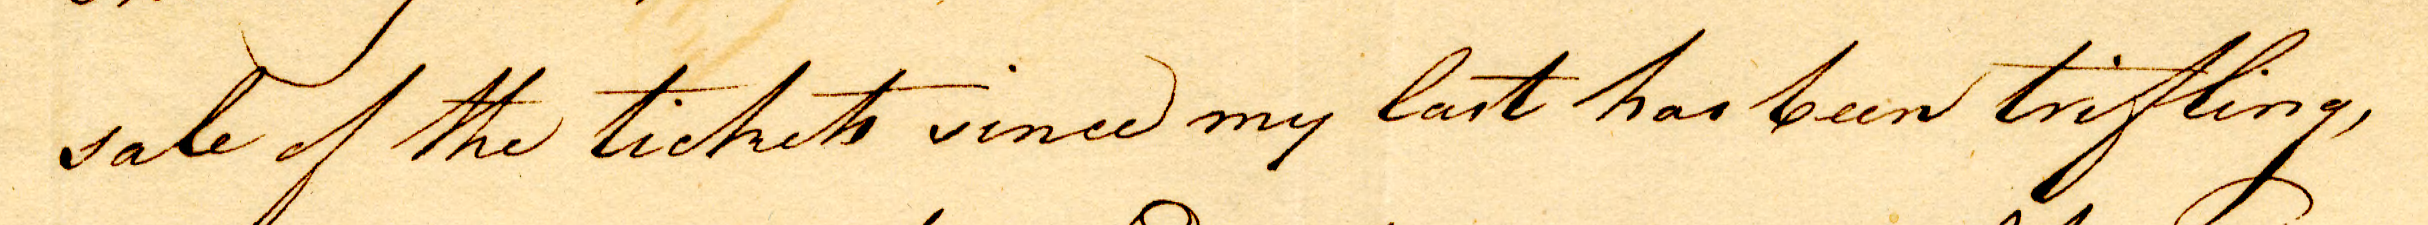sale of the tickets since my last has been trifling,
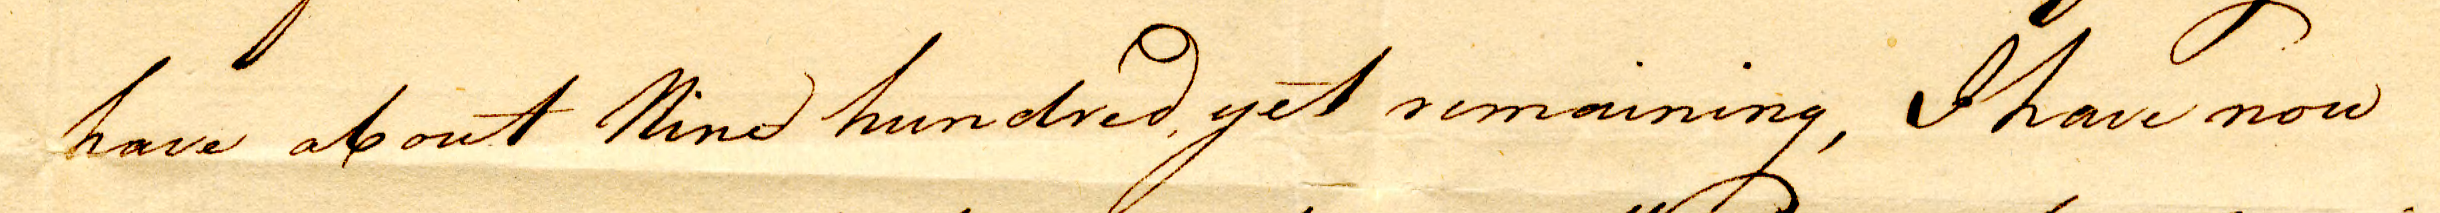have about Nine hundred yet remaining, I have now
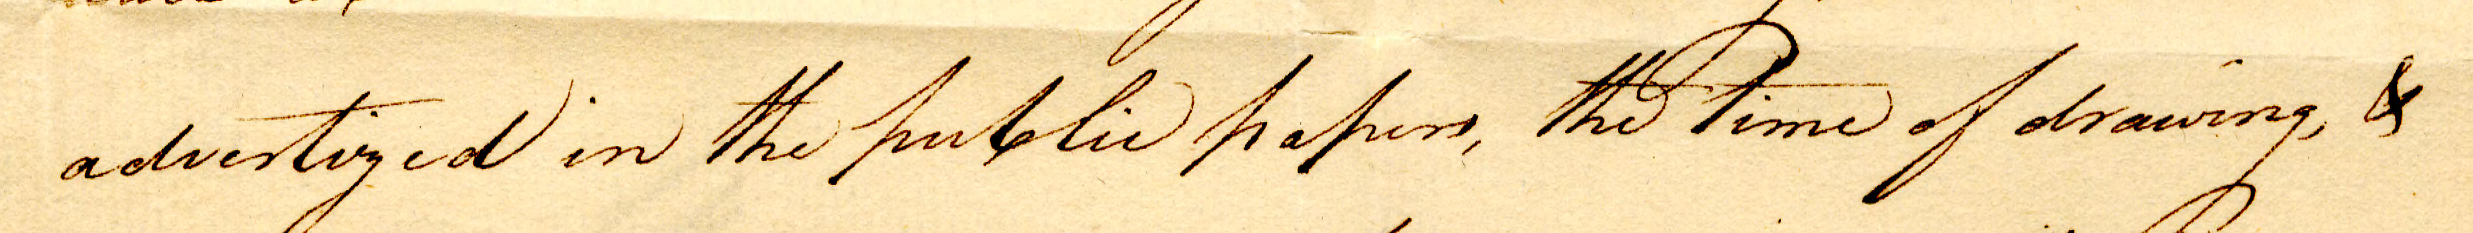advertised in the public papers, the time of drawing, &
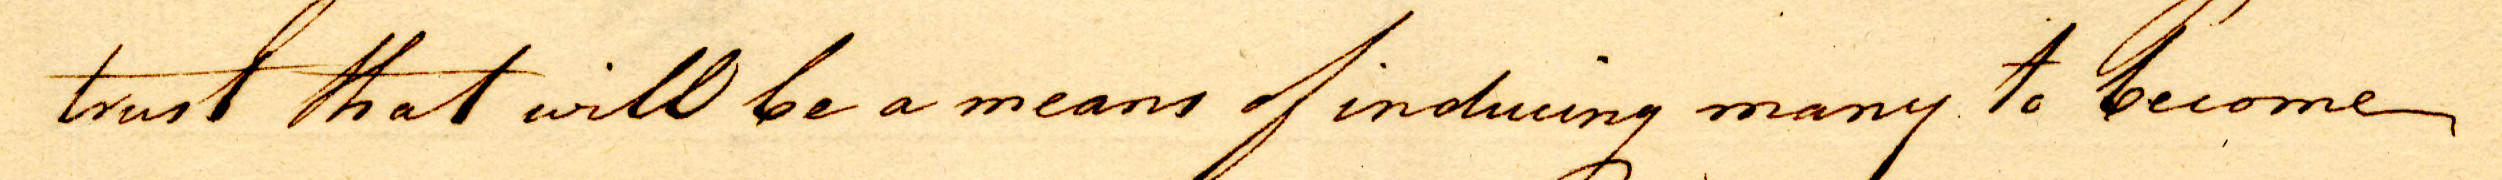trust that will be a means of inducing many to become
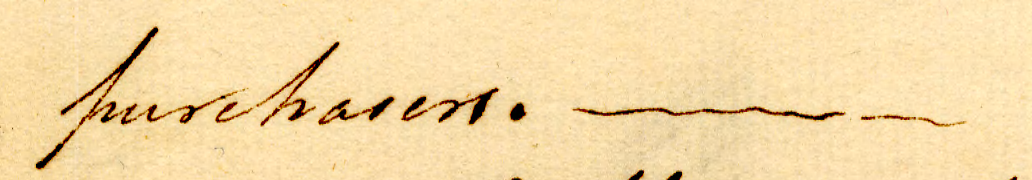purchasers.-
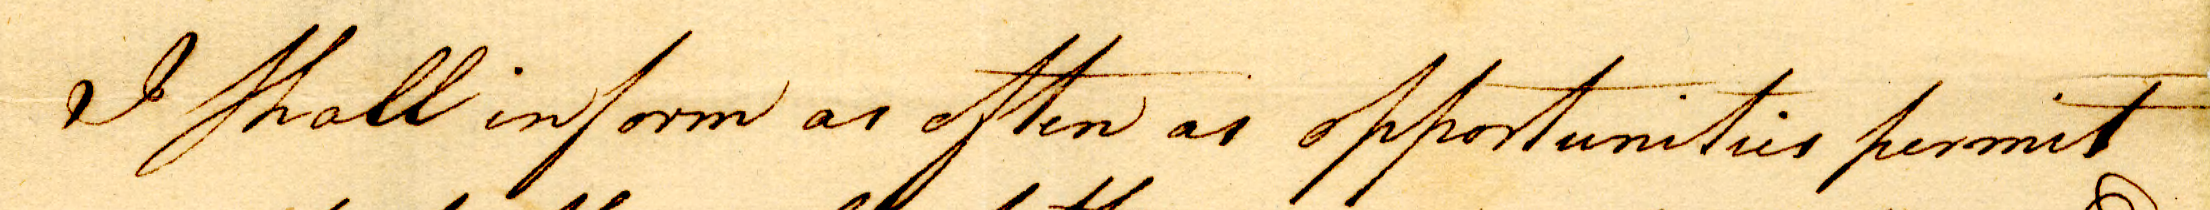I shall inform as often as opportunities permit
